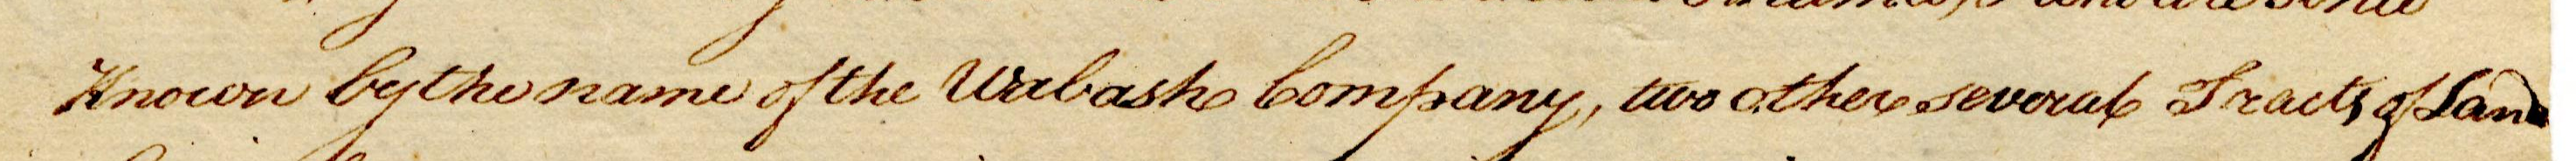known by the name of the Wabash Company, two other several Tracts of land
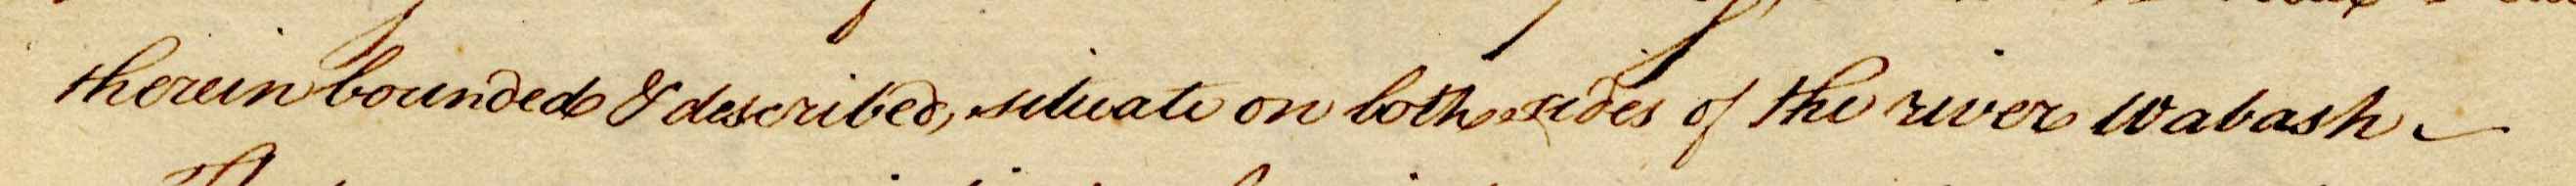therein bounded I described, indicate on both sides of the river wabash-
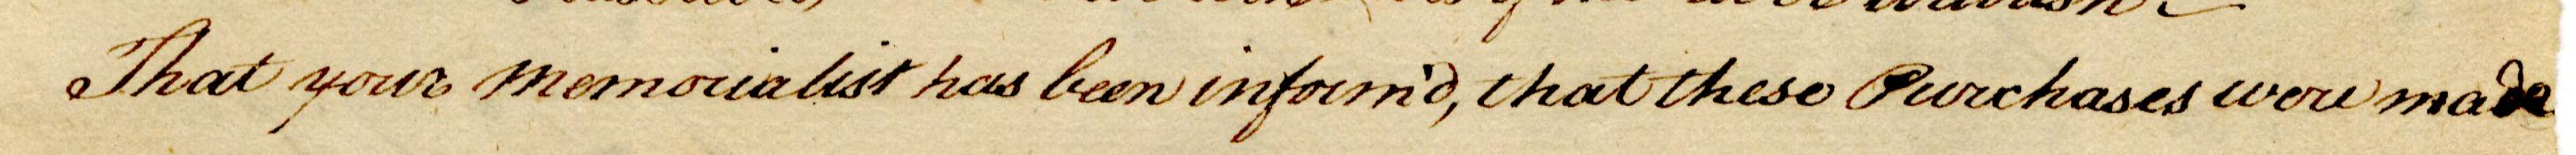That your memorialist has been inform'd, that these Purchases were made
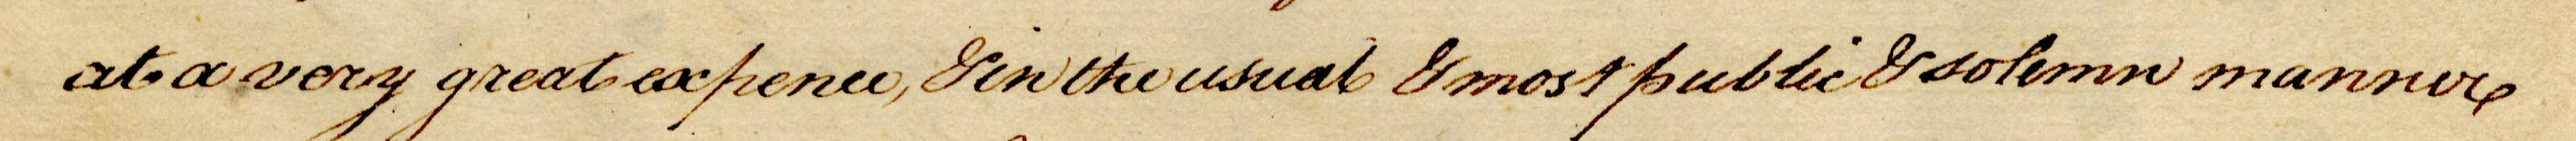at a very great expence, & in in the usual & most public & solemn manner
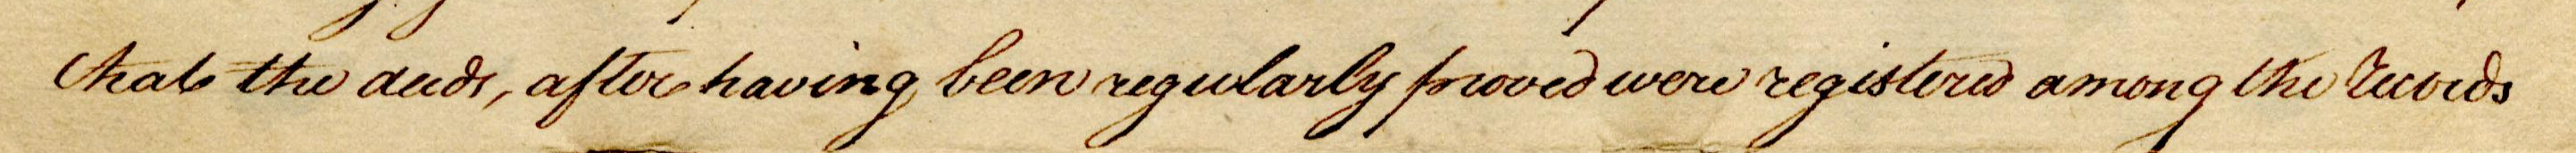that the deeds, after having been regularly proved were registered among the records
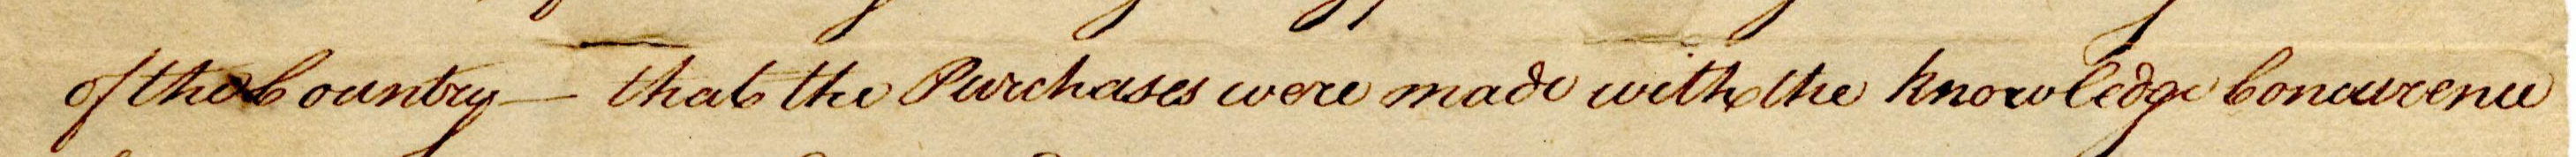of the country- that the Purchases were made with the knowledge Concurrence
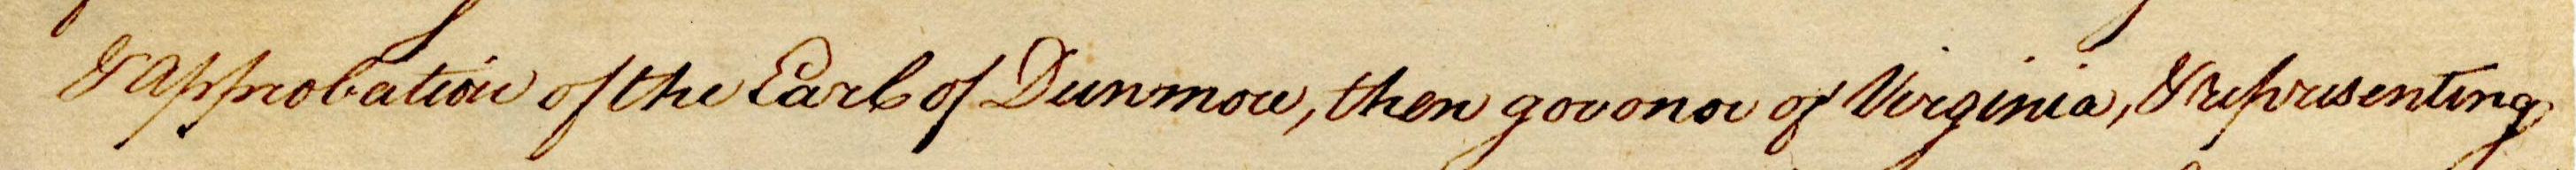& Approbation of the Earl of Dunmore, then governor of Virginia, & representing
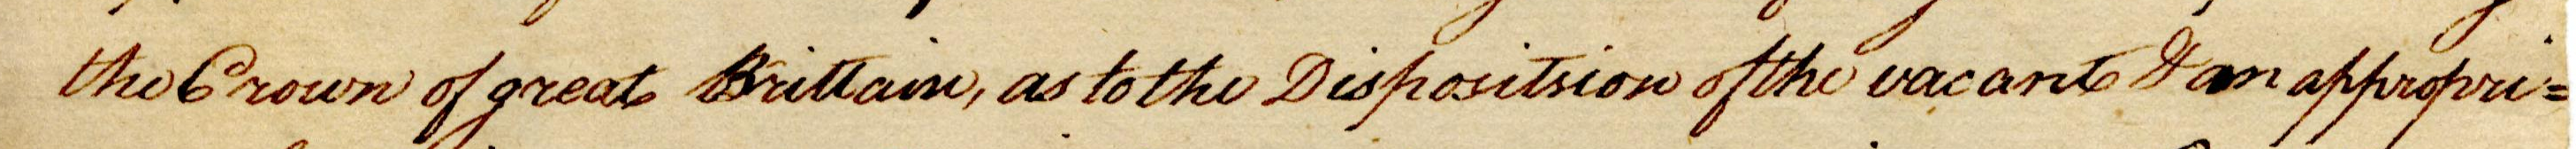the Crown of Great Brittain, as to the Disposition of the vacant & an appropri-
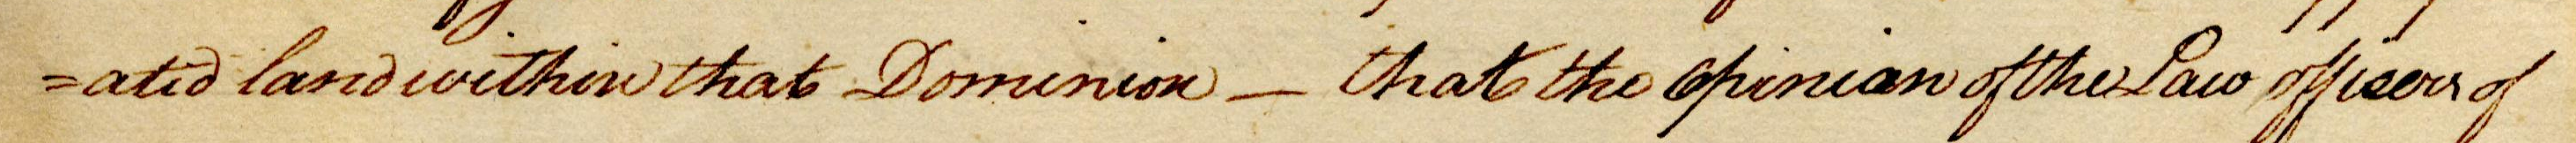-ated land within that Dominion- that the opinion of the Law officer of
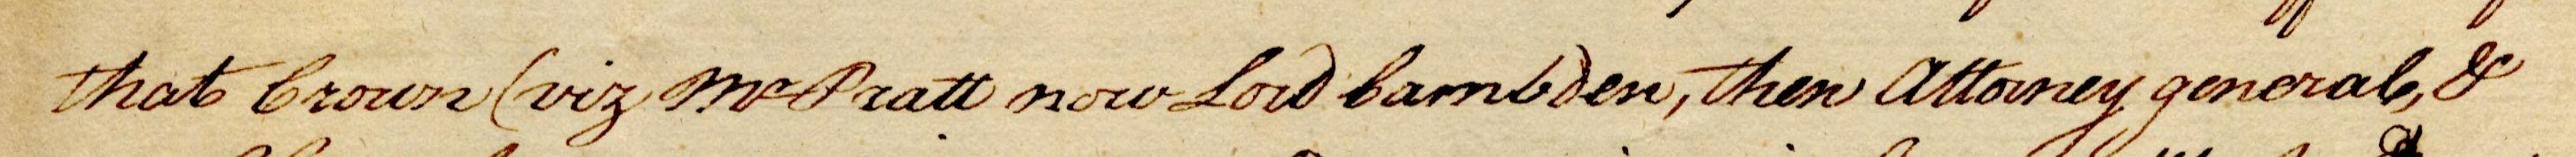that Crown (viz M^cPratt now Lord Cambden, then attorney general, &
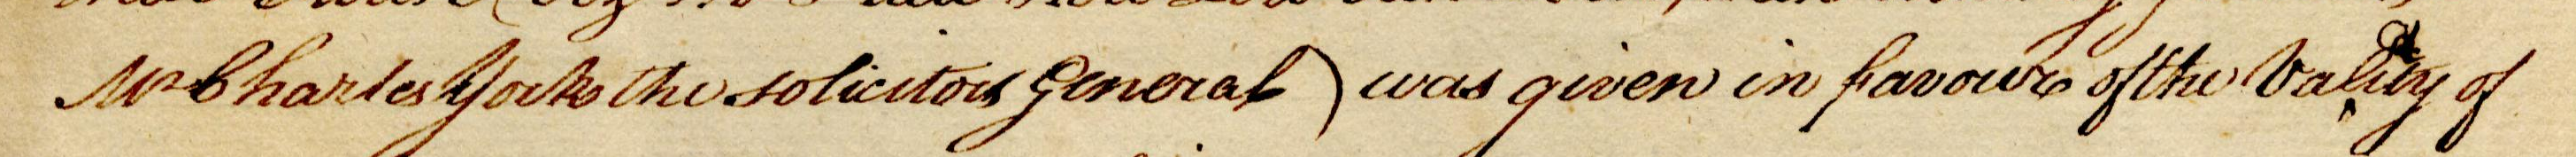M^r Charles York the solicitors general) was given in favor of the vali^dity of
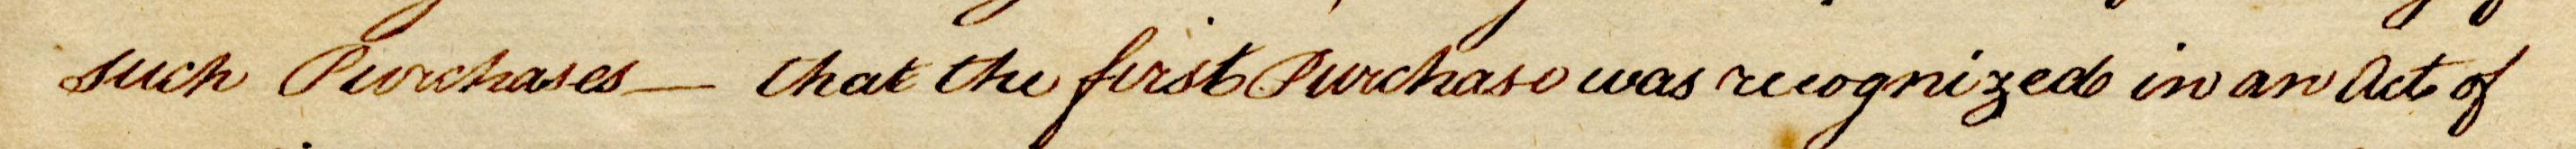such Purchases- that the first Purchase was recognized in an Act of
